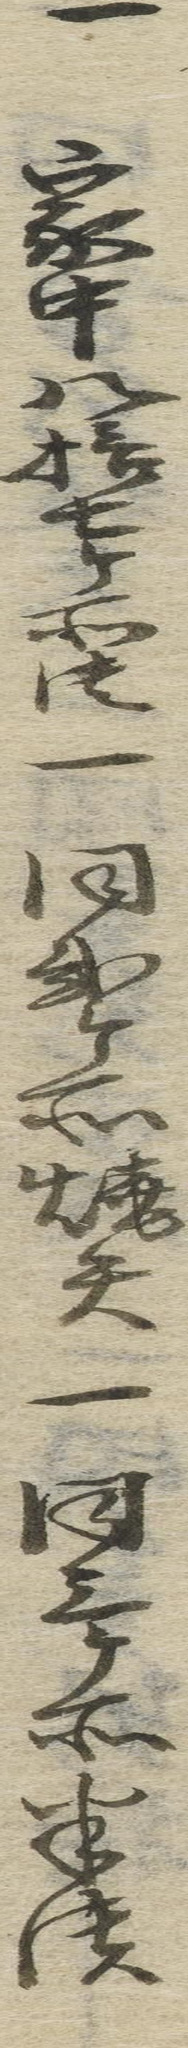一家中八拾七ヶ所潰一同弐ヶ所焼失一同三ヶ所半潰
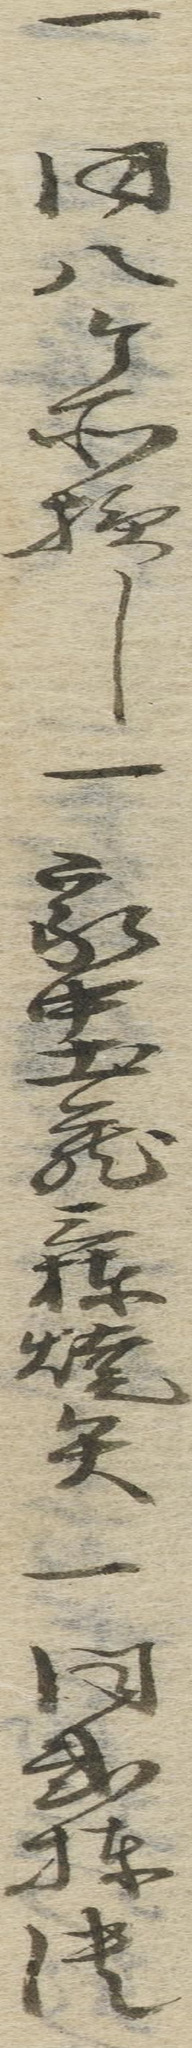一同八ヶ所損し一家中土蔵三棟焼失一同弐棟潰

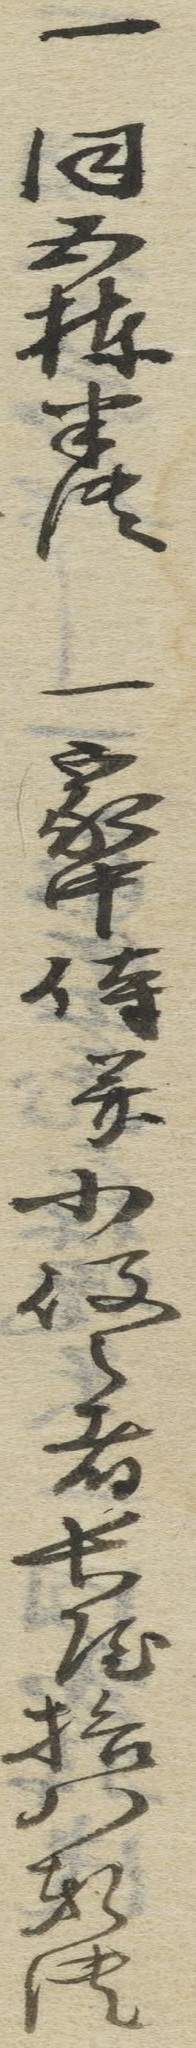一同五棟半潰一家中侍并小役之者長屋拾八軒潰
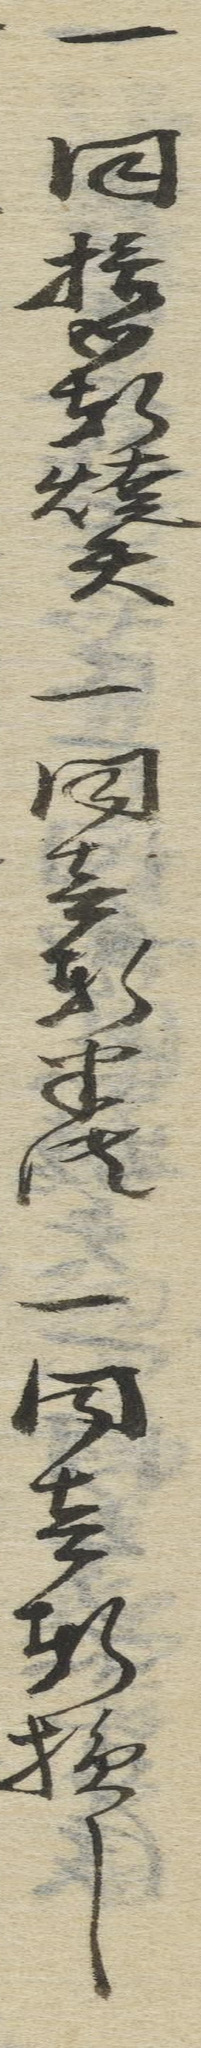一同拾弐軒焼失一同壱軒半潰一同壱軒損し
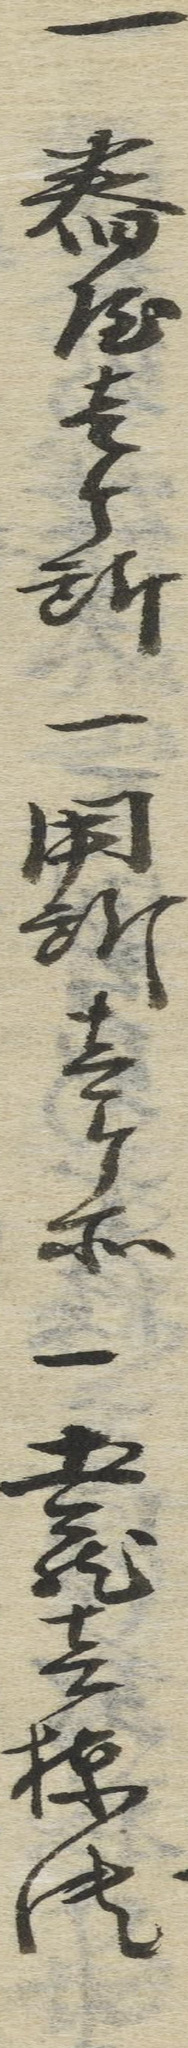一舂蔵壱ヶ所一同断壱ヶ所一土蔵壱棟潰
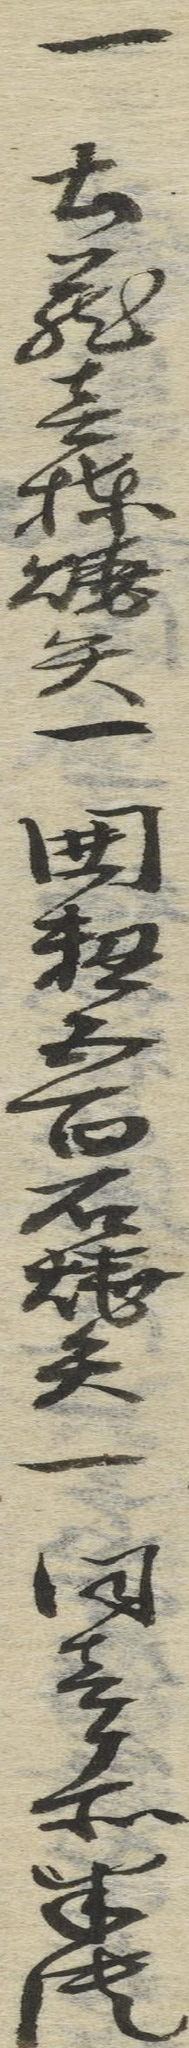一土蔵壱棟焼失一囲籾五百石焼失一同壱ヶ所半潰
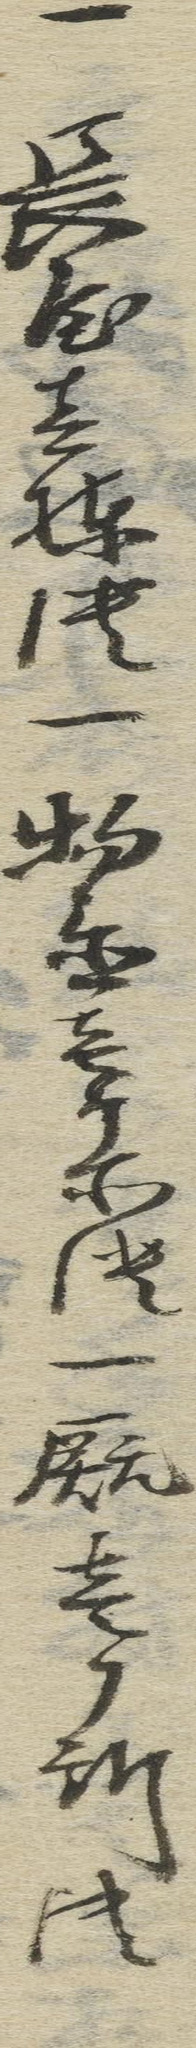一長屋壱棟潰一物置壱ヶ所潰一厩壱ヶ所潰
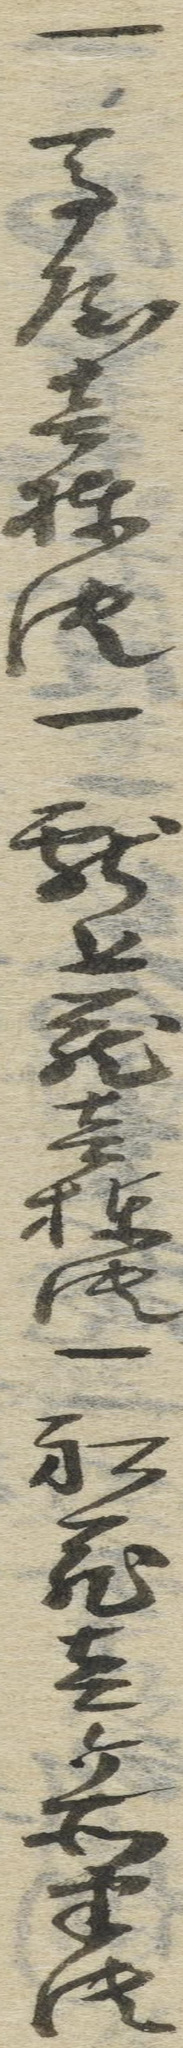一馬屋壱棟潰一献上蔵壱棟潰一船蔵壱ヶ所半潰
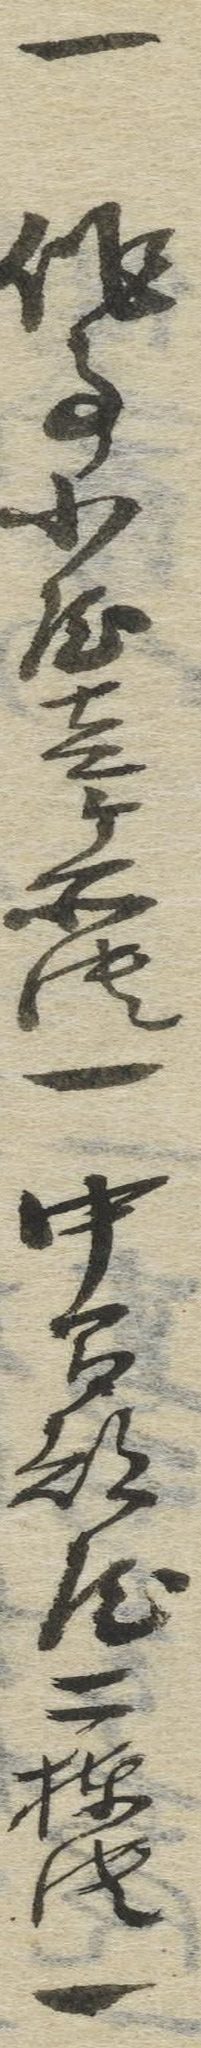一作事小屋壱ヶ所潰一中間部屋二棟潰一
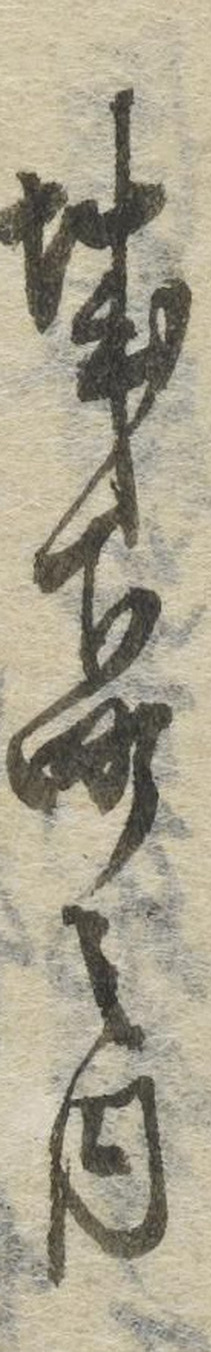城下町之内
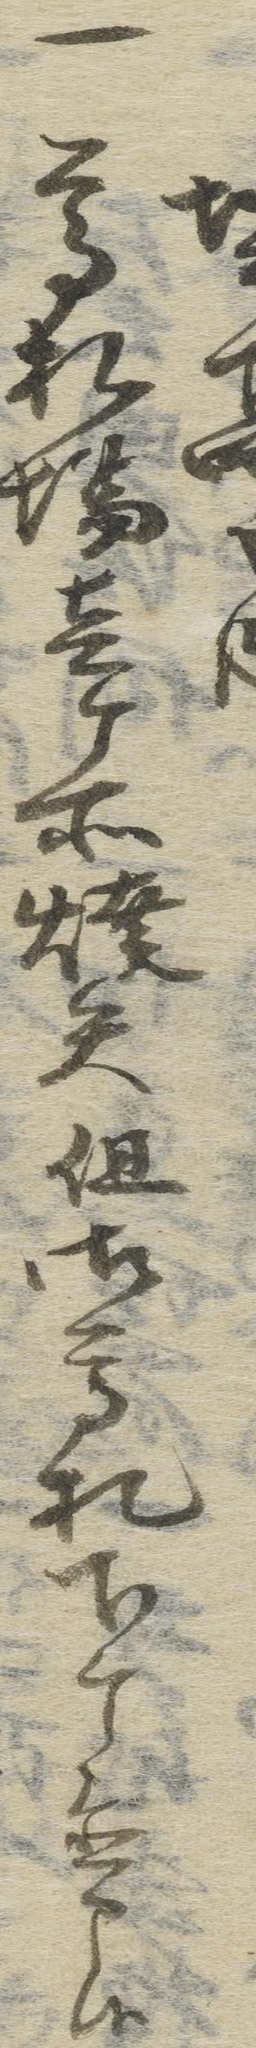一高札場壱ヶ所焼失但御高札下ヶ置申候
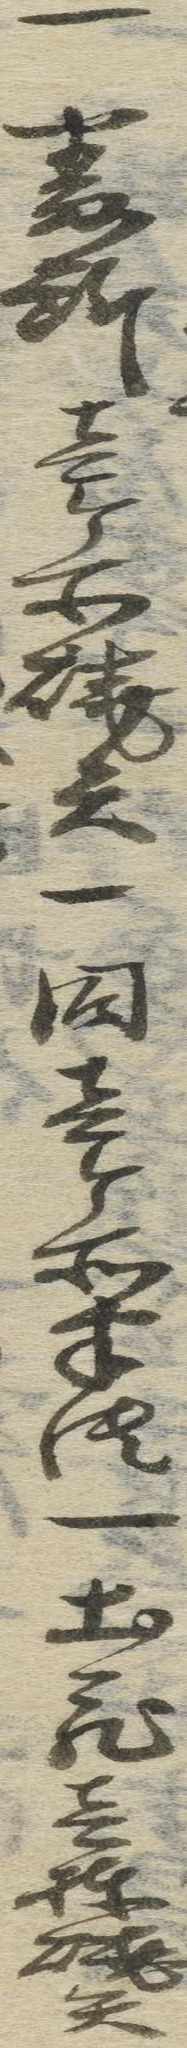一番所壱ヶ所焼失一同壱ヶ所半潰一土蔵一棟焼失
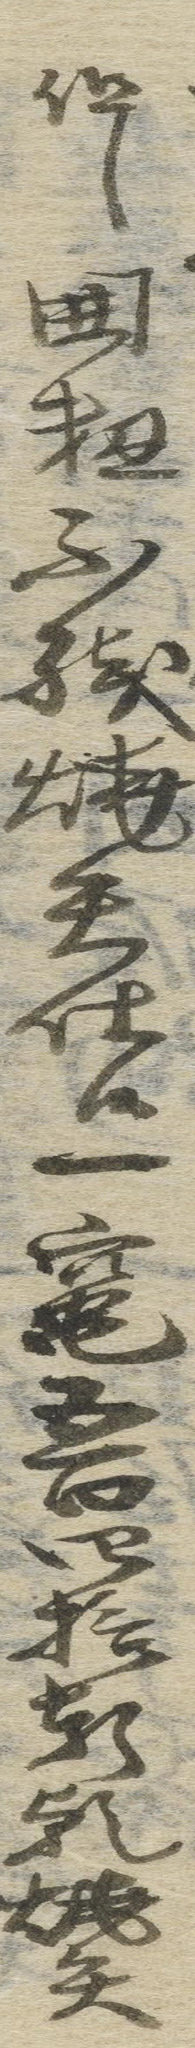但し囲籾不残焼失仕候一竈五百四拾軒歟焼失
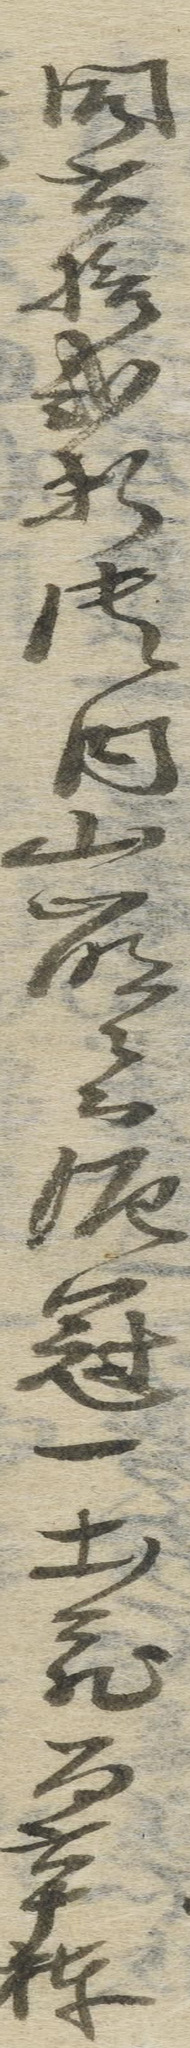一同六拾弐軒潰同山崩二而泥冠一土蔵百六拾棟
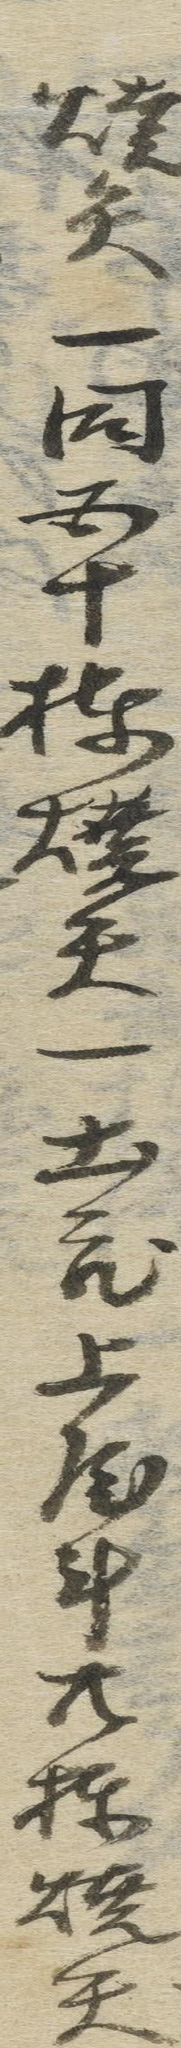焼失一同五十棟焼失一土蔵上屋計廿棟焼失
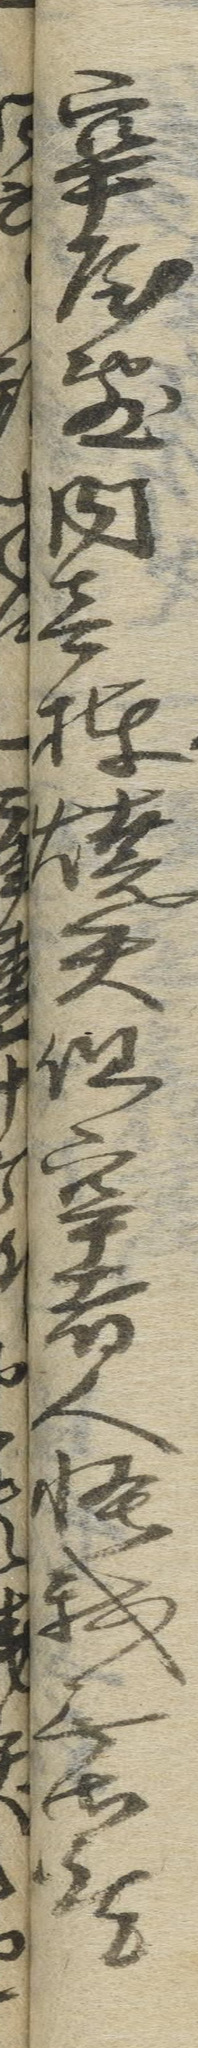一牢屋敷内壱棟焼失但牢者人怪我無御座候
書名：信濃越後　地震書留
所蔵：東京大学地震研究所図書室 Earthquake Research Institute Library, The University of Tokyo, JAPAN
